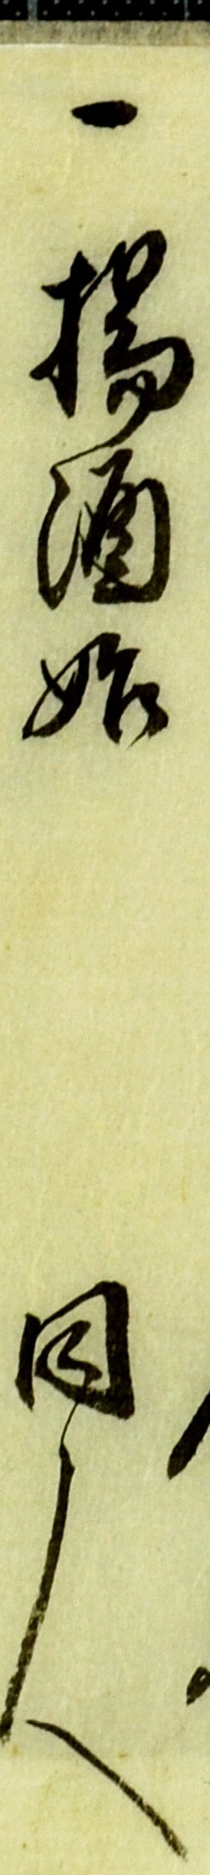一揚酒始同人
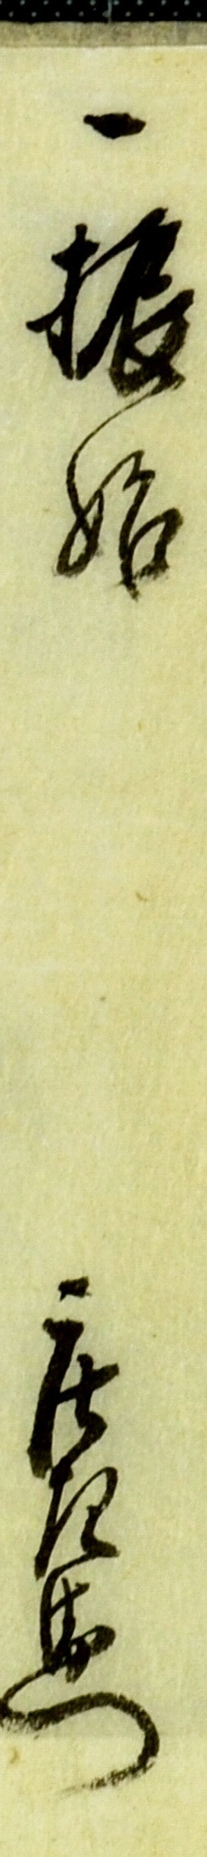一振始庄左衛門
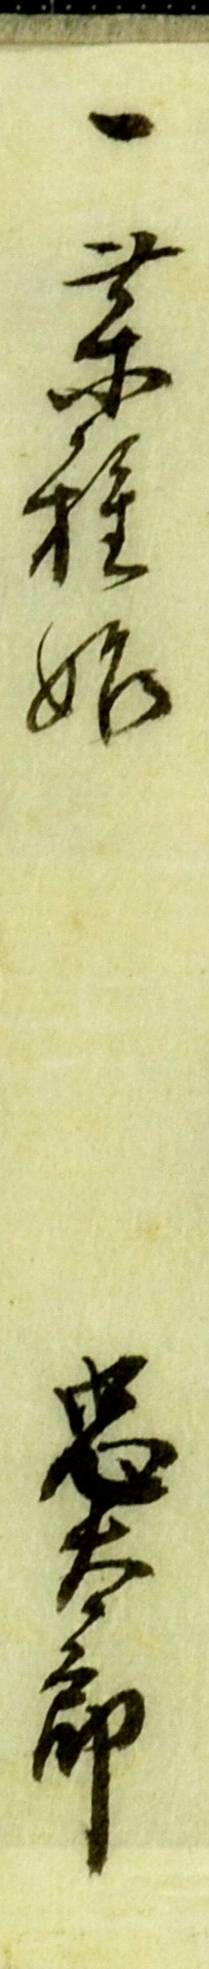一菜種始忠太郎
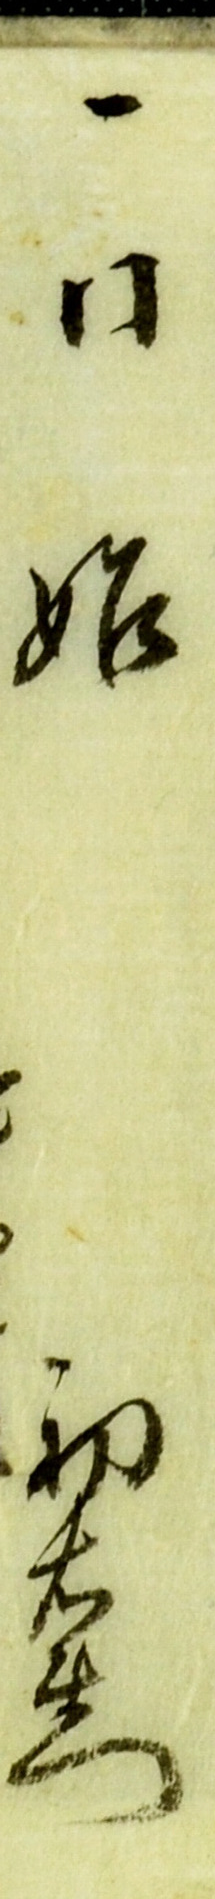一同始初右衛門
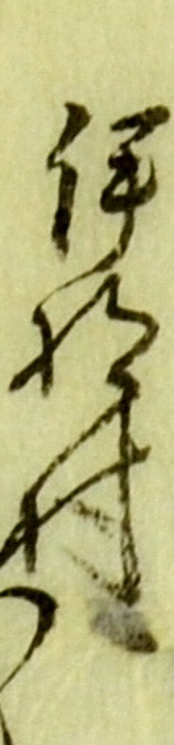伊那村
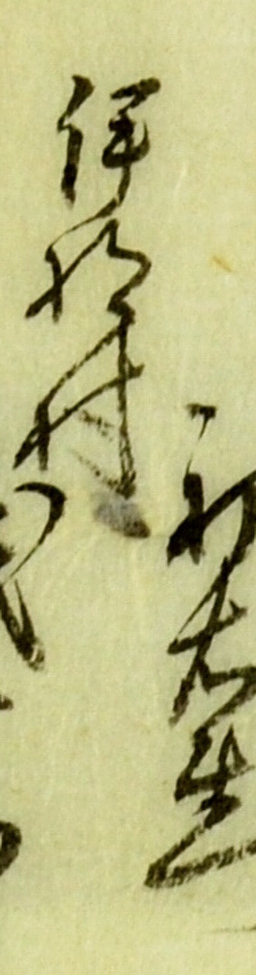伊那村
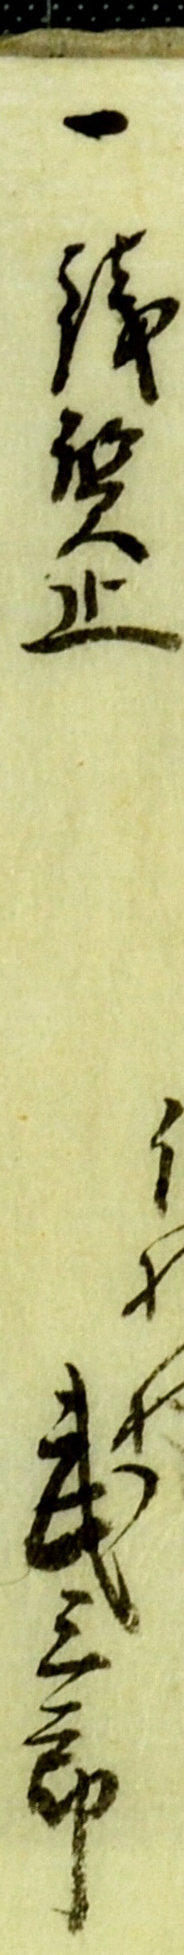一銭質止武三郎

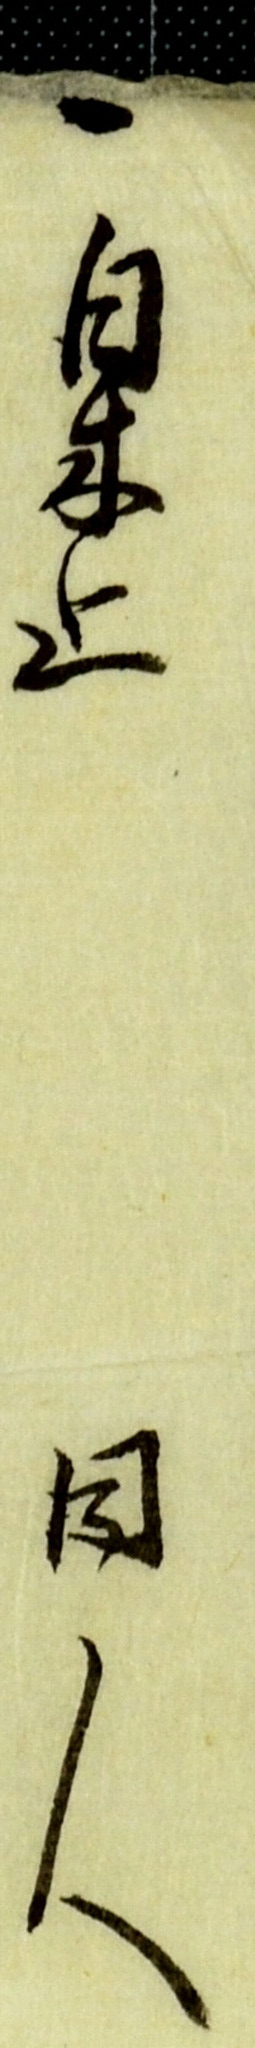一白木止同人
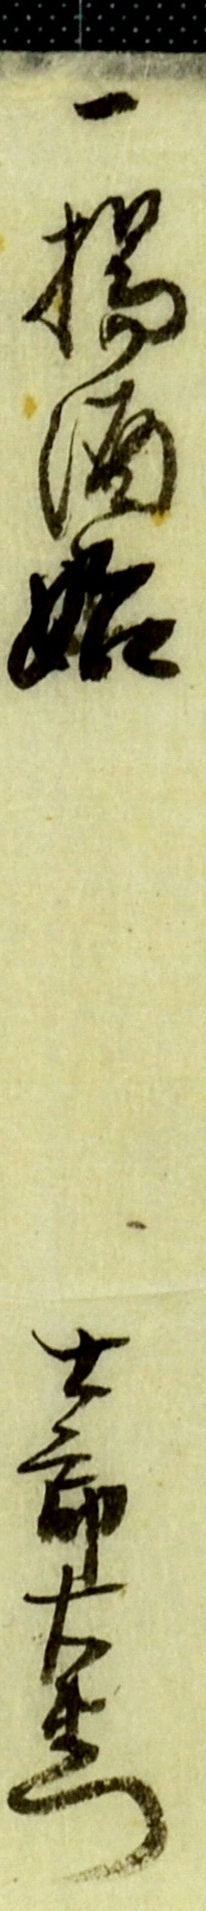一揚酒始士郎右衛門
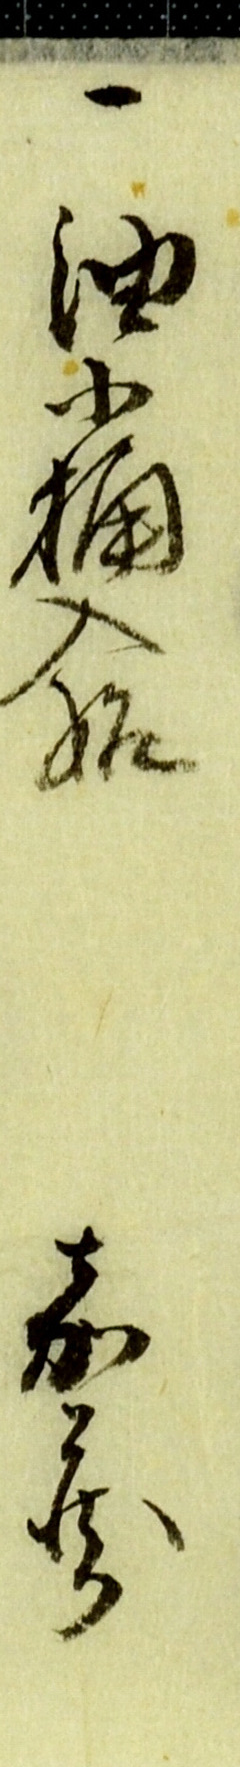一油小桶入始嘉蔵
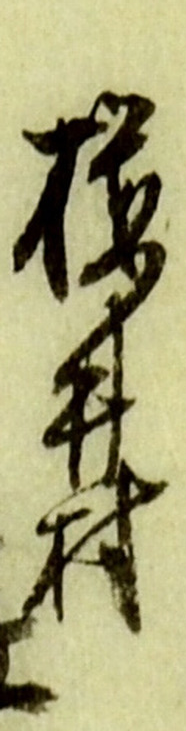桜井村
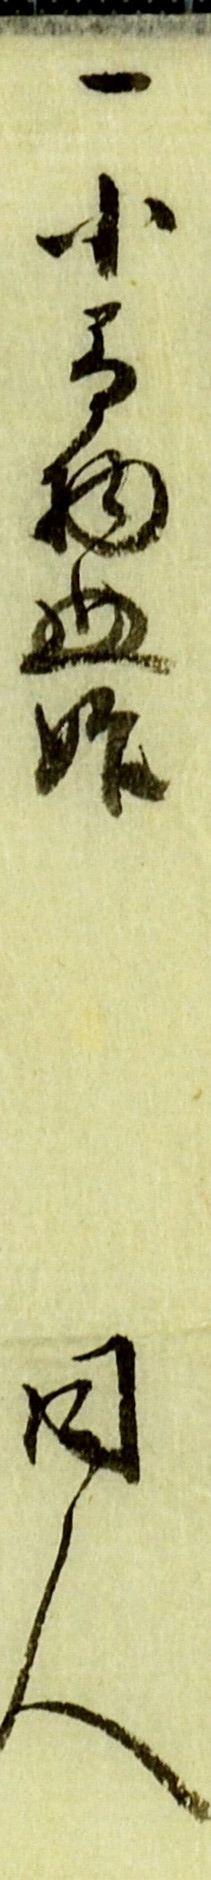一小間物始同人
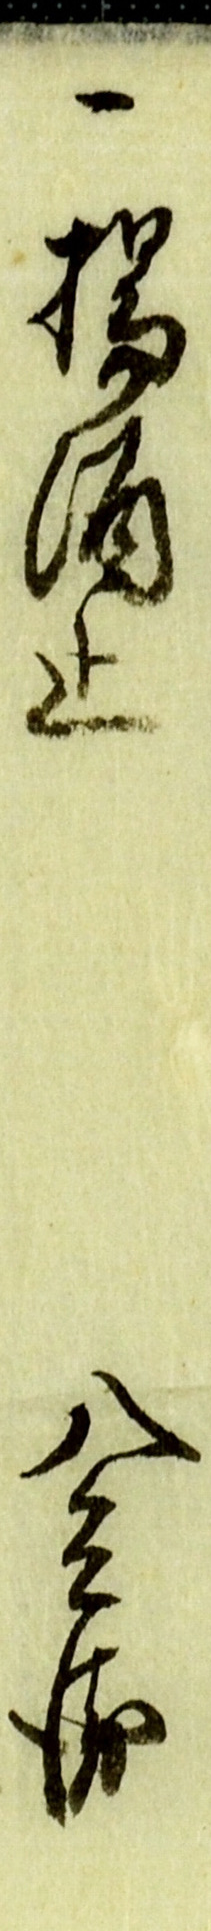一揚酒止八兵衛
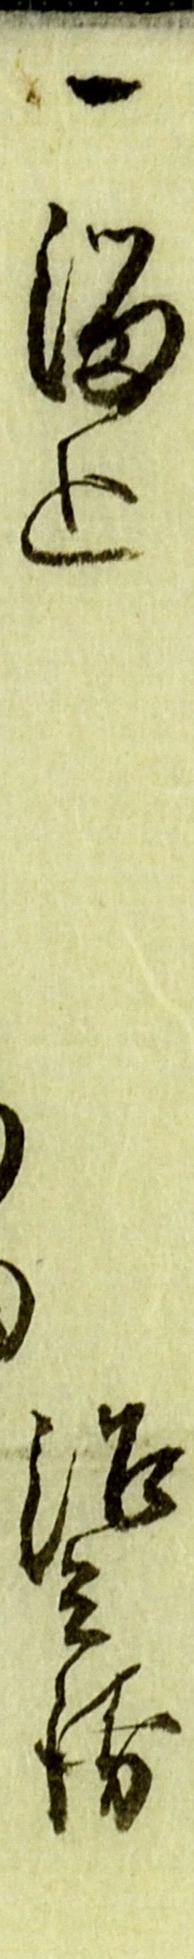一溜止治兵衛
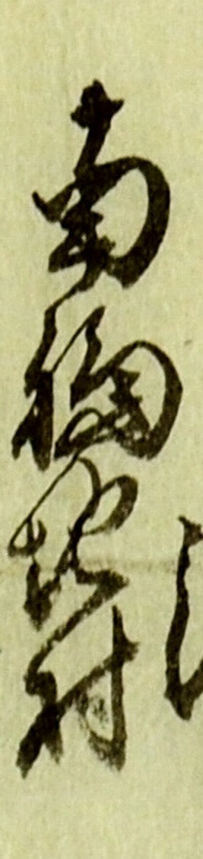南福地村
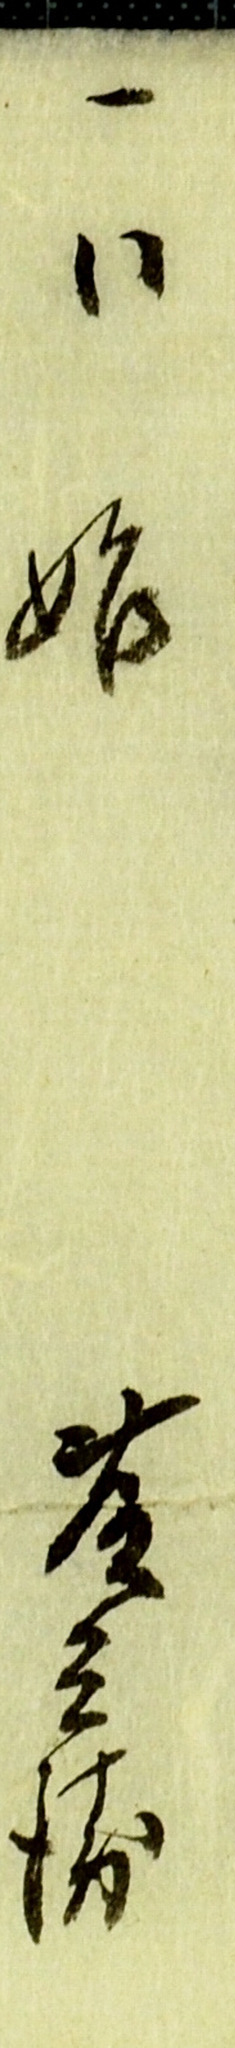一同始藤兵衛
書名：郷方掛合帳
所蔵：伊那市立高遠町図書館・合同会社AMANE
